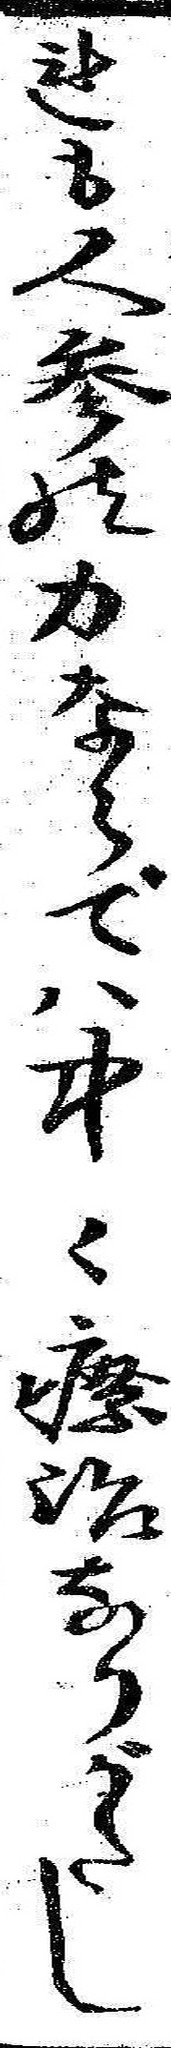れも人参の力ならでは中々療治なりがたし
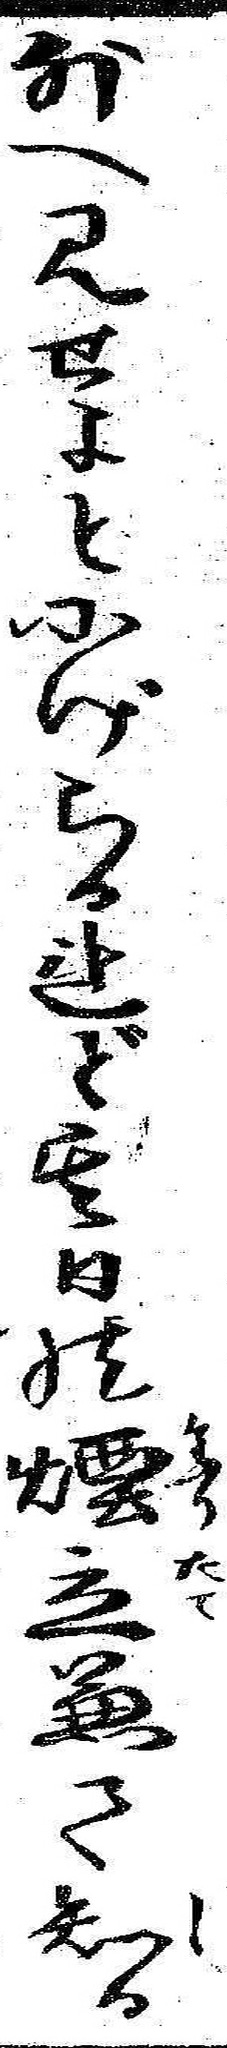外へ見せよとにげらるれど其日の煙立兼て知る
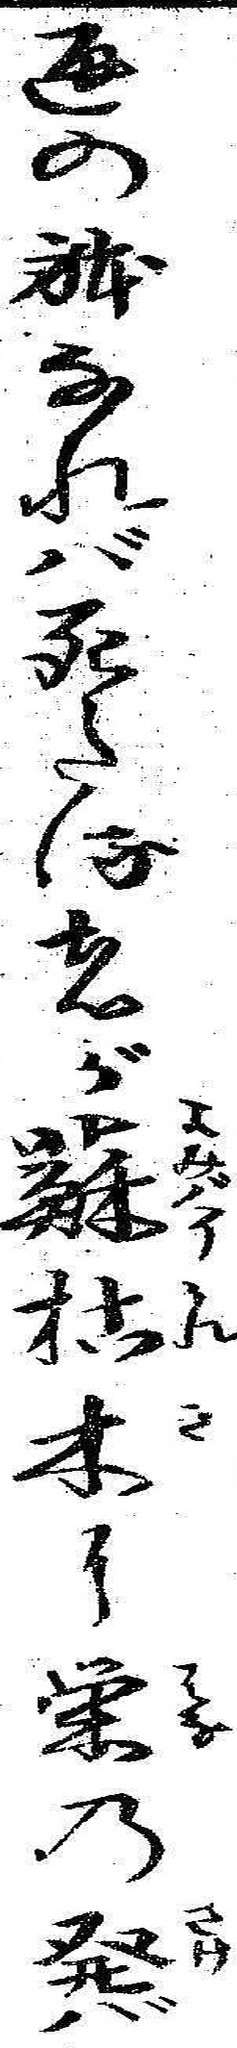通の体なれば死たる者が蘇枯木に栄の発ば
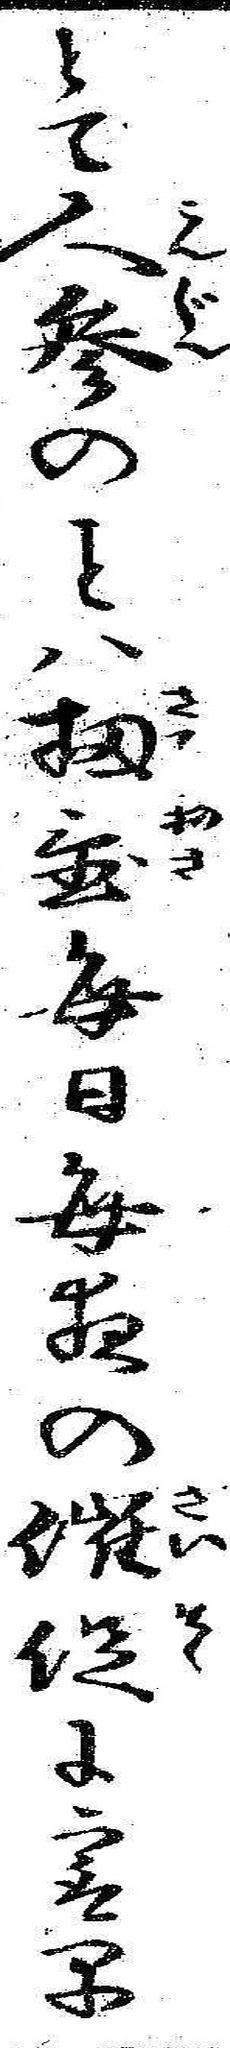とて人参のことは扨置毎日毎夜の催促に最早
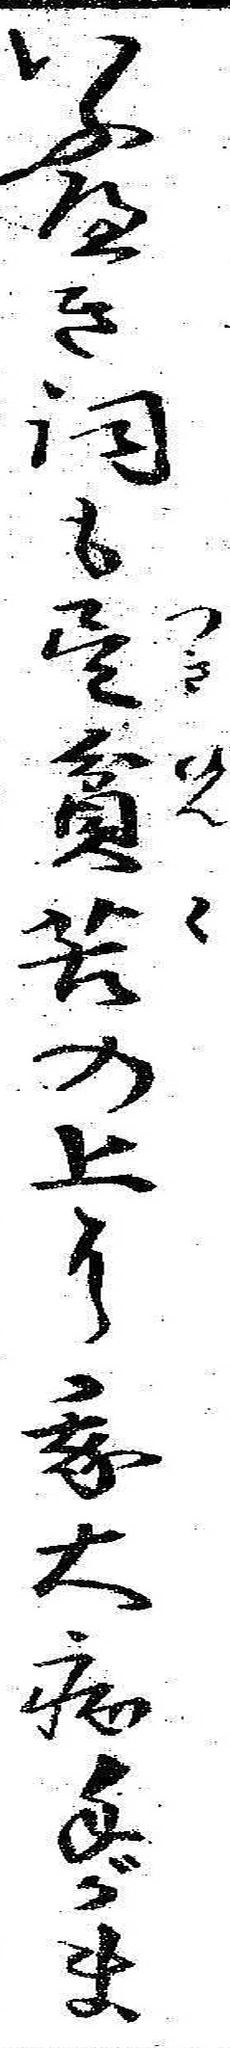いふへき詞も尽貧苦の上に我大病手がま
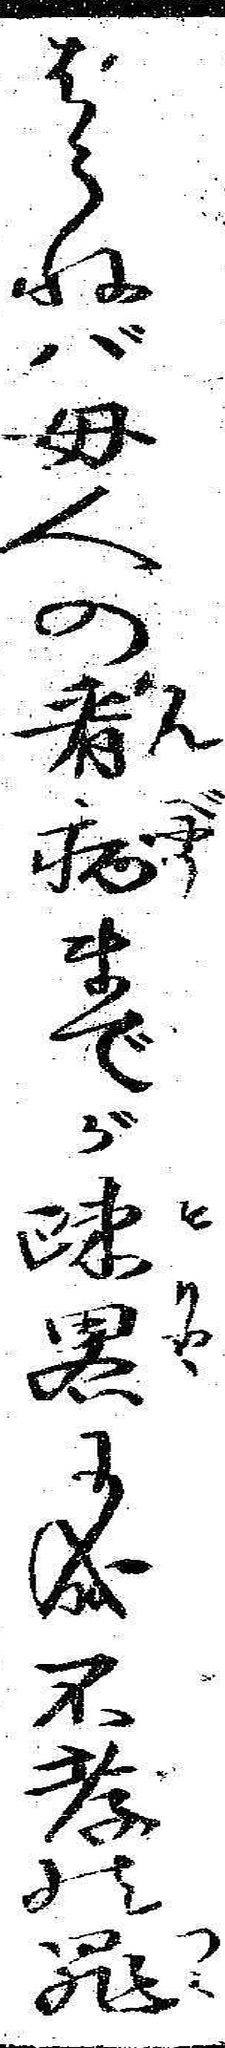はらねば母人の看病までが疎略に成不孝の罪
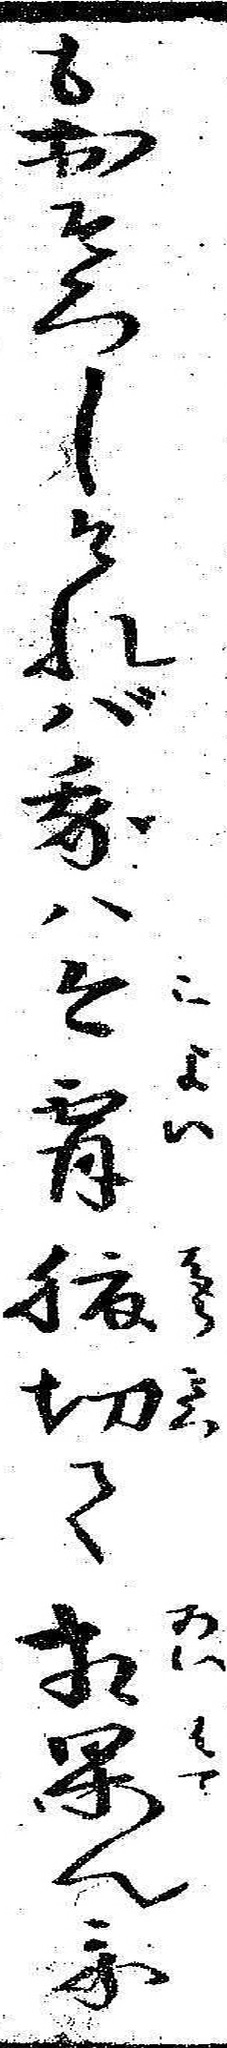もおそろしければ我は今宵腹切て相果ん我
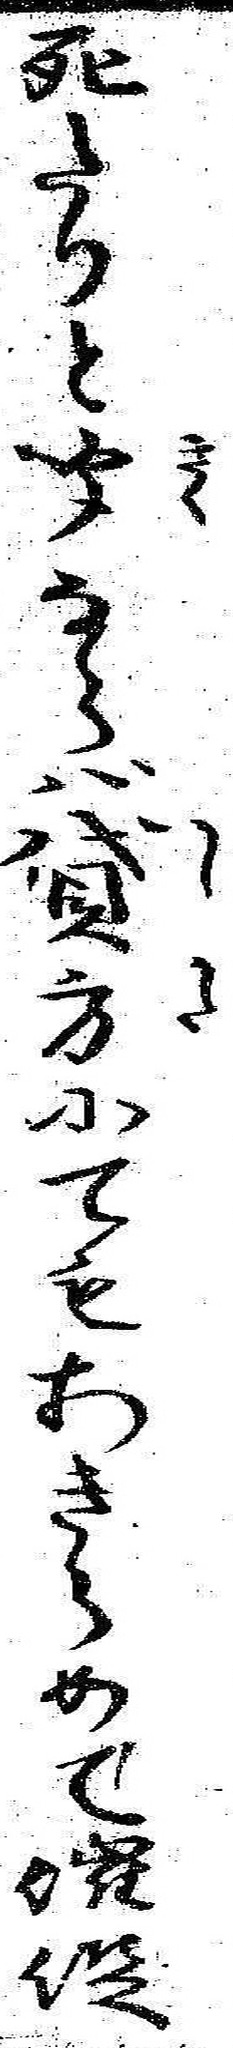死たりと聞ならば貸方にてもあきらめて催促

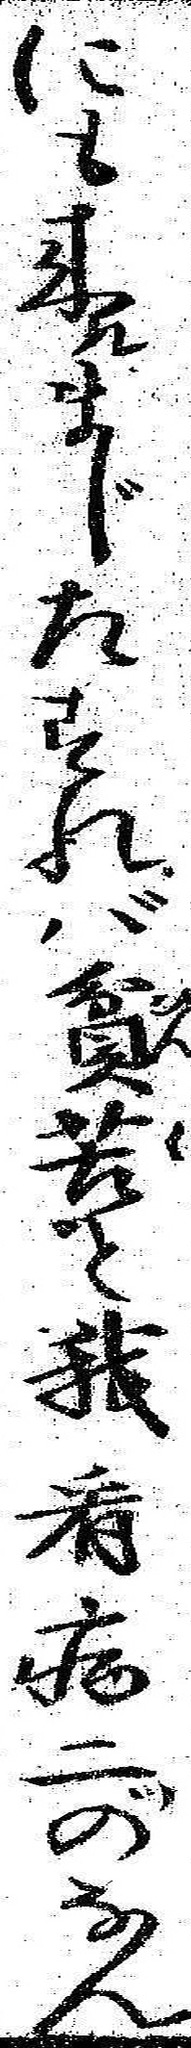にも来るまじ左すれば貧苦と我看病二ッのなん
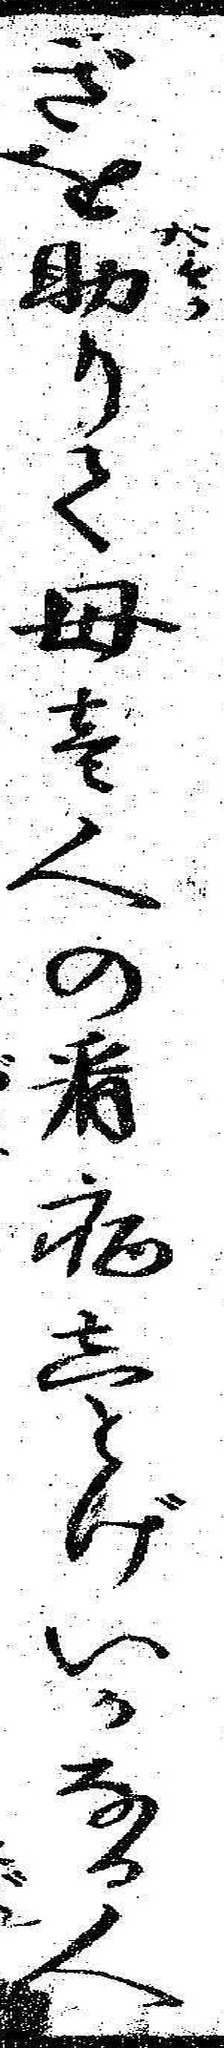ぎを助りて母壱人の肴病しとげいかなる人
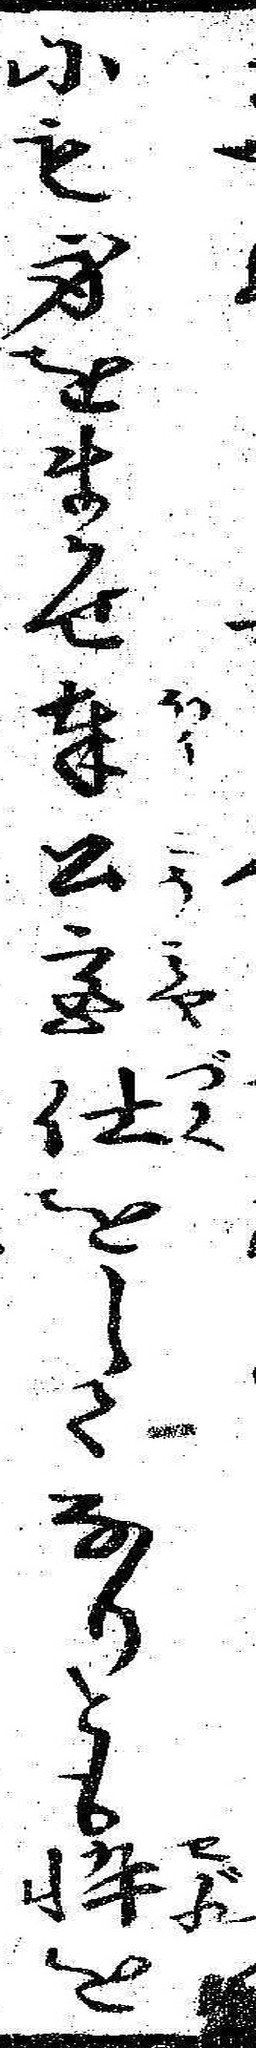にも身をまかせ奉公宮仕をしてなりとも忰を
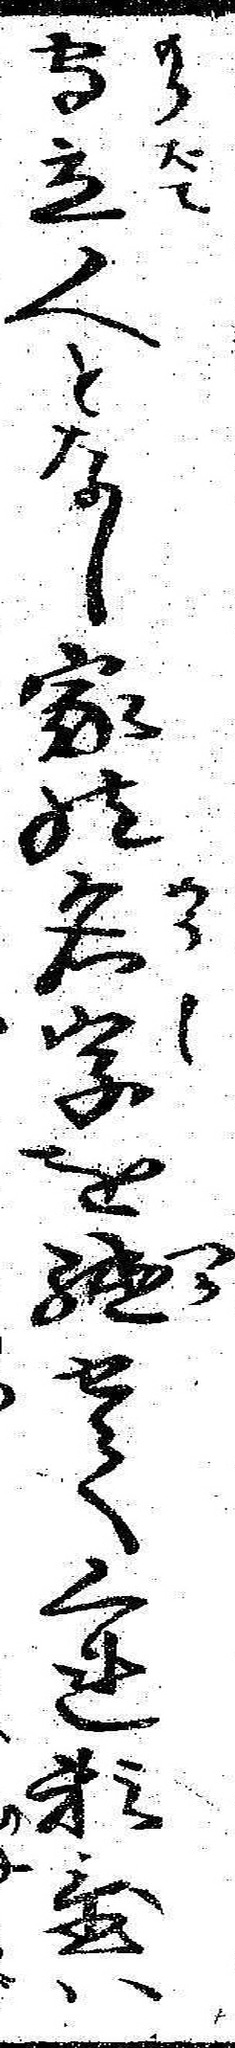守立人となし家の名字を継せてくれ頼置は
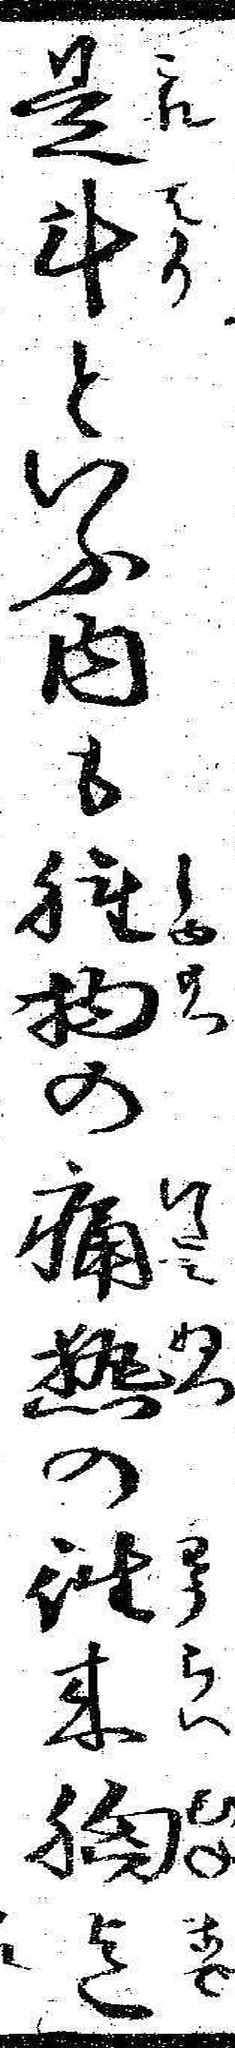是斗といふ内も腫物の痛熱の往来胸迄
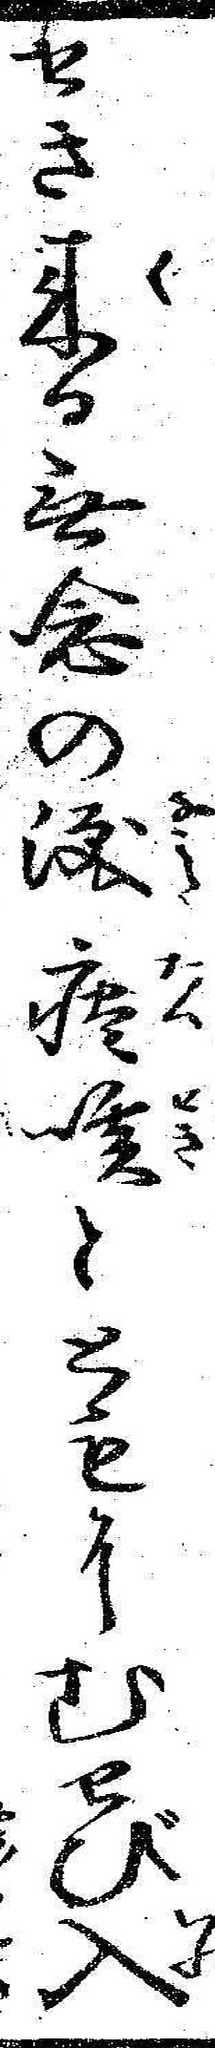せき来る無念の涙痰咳とともにむせび入
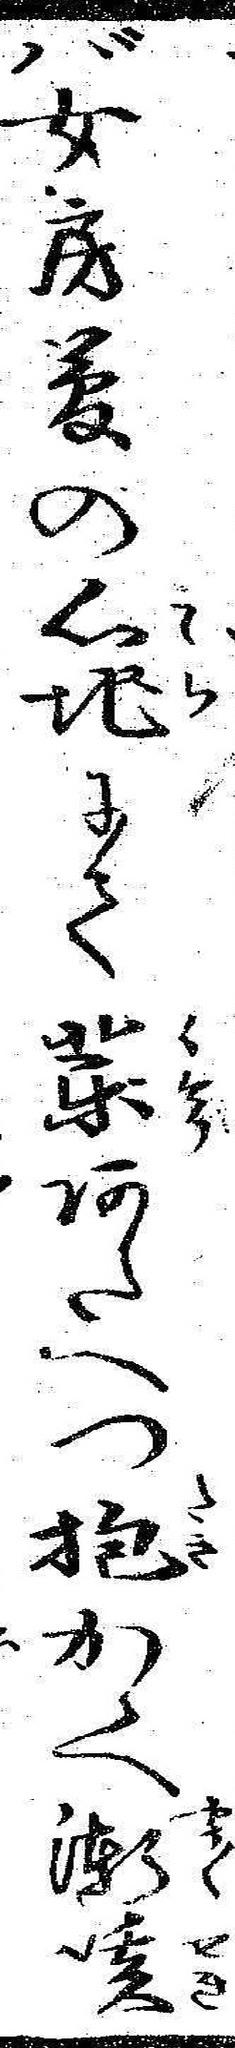ば女房夢の心地にて薬あたへつ抱かゝへ漸咳
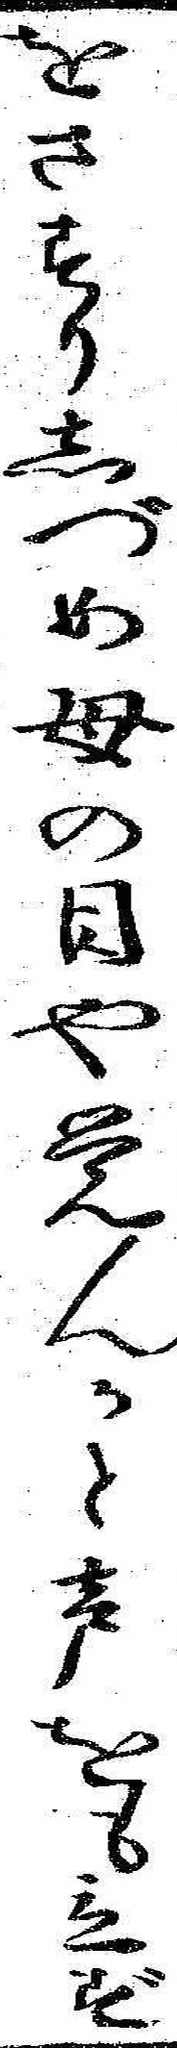をさすりしづめ母の目や覚んかと声をも立ず
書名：根無草後編
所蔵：国文学研究資料館
